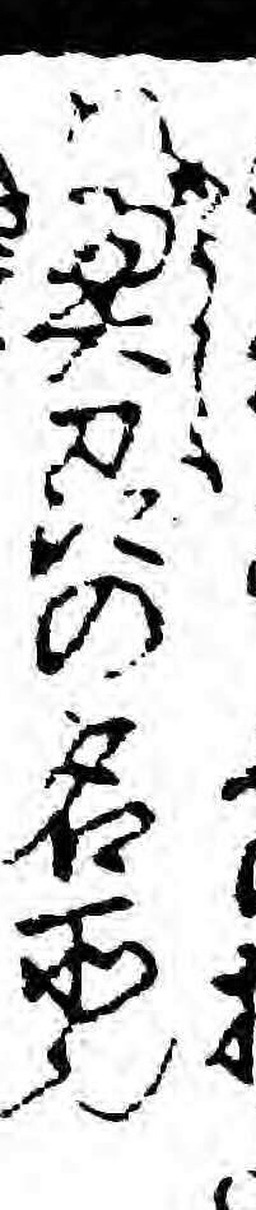は奥州の名所也
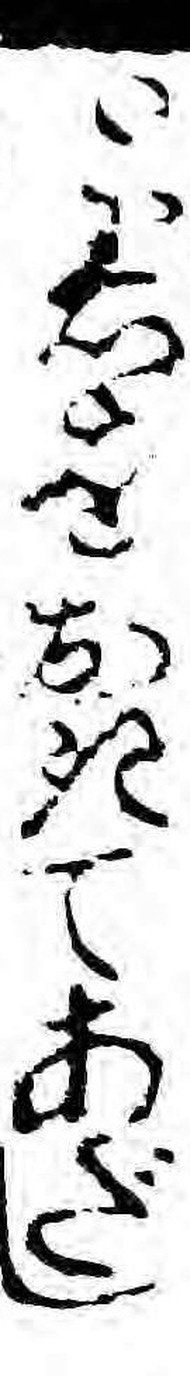〇君をおきてあだし
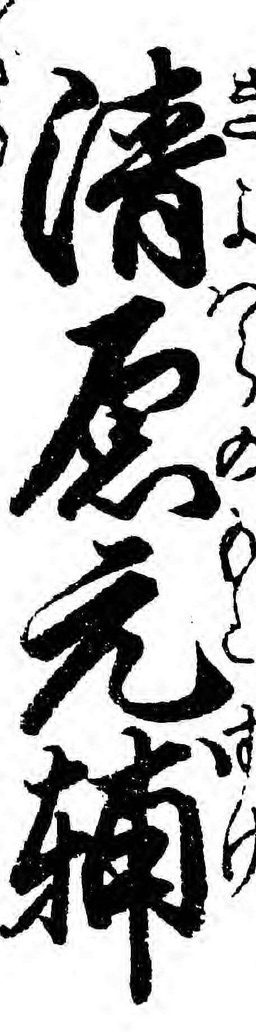清原元輔
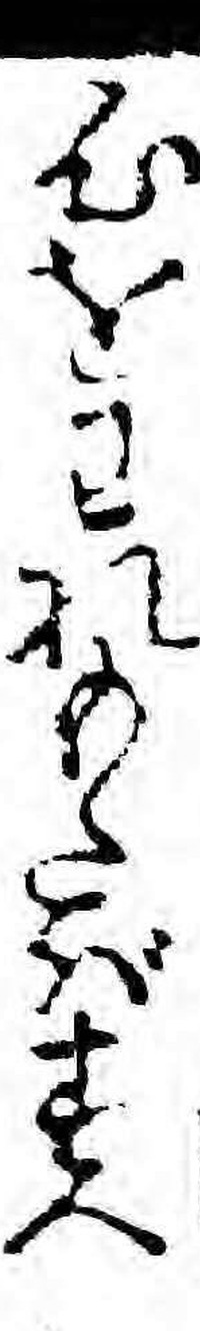心をわれもたばすへ
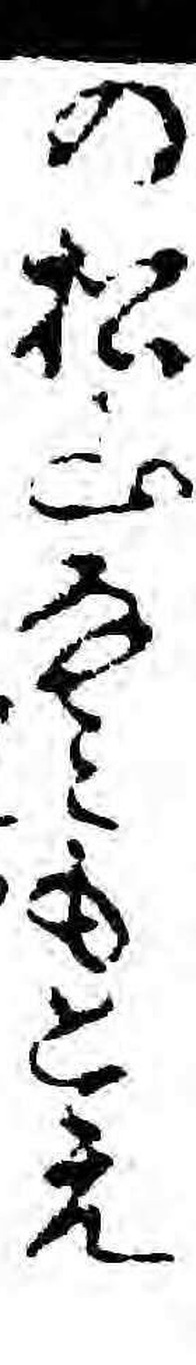の松山なみもこえ
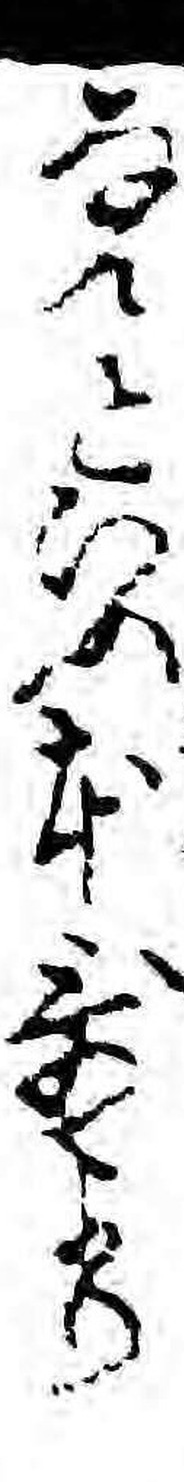なんといふ本哥より
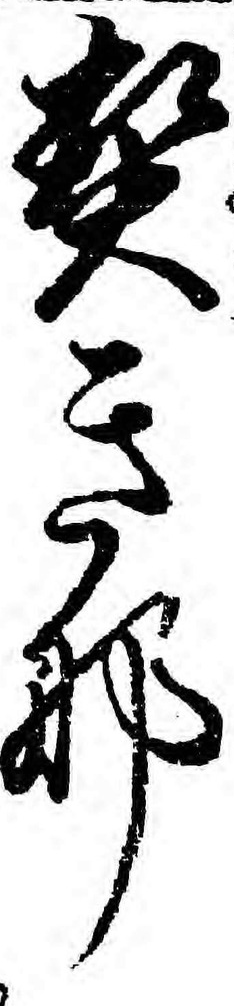契きな
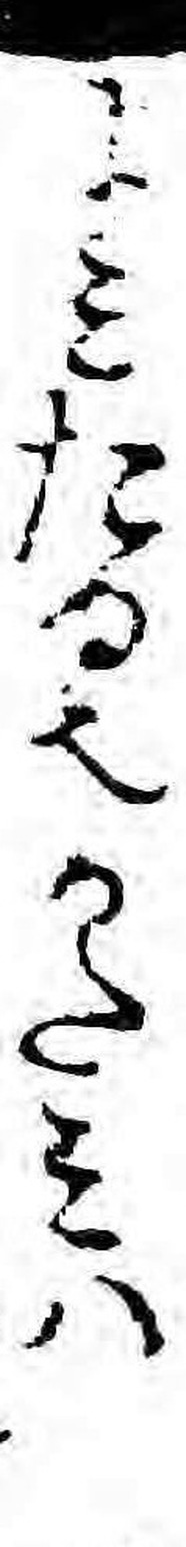よみたる也かたみは
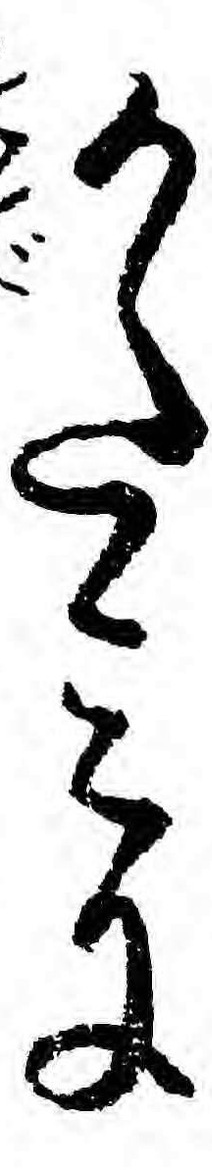かたみに
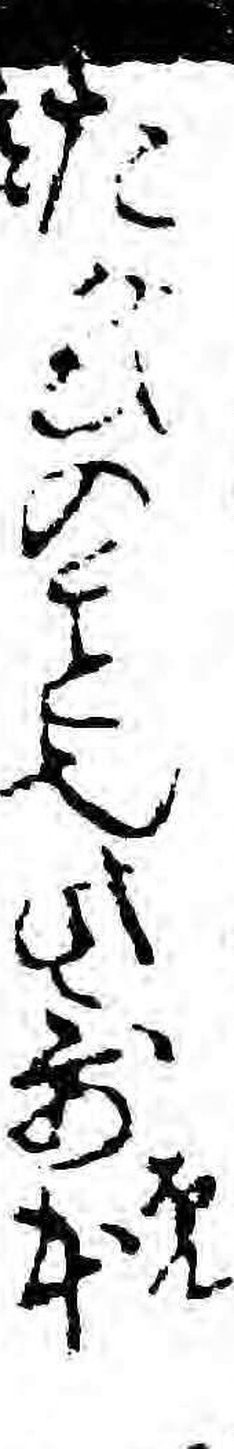たがひのこと也此哥本
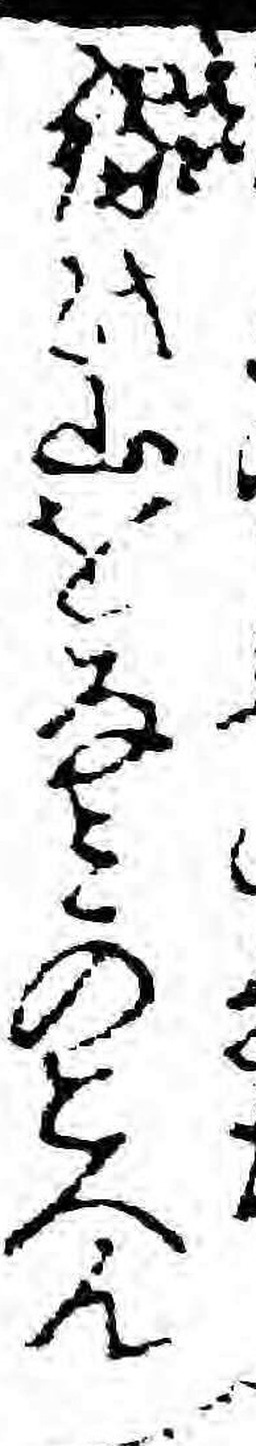縁此山をなみのこへん
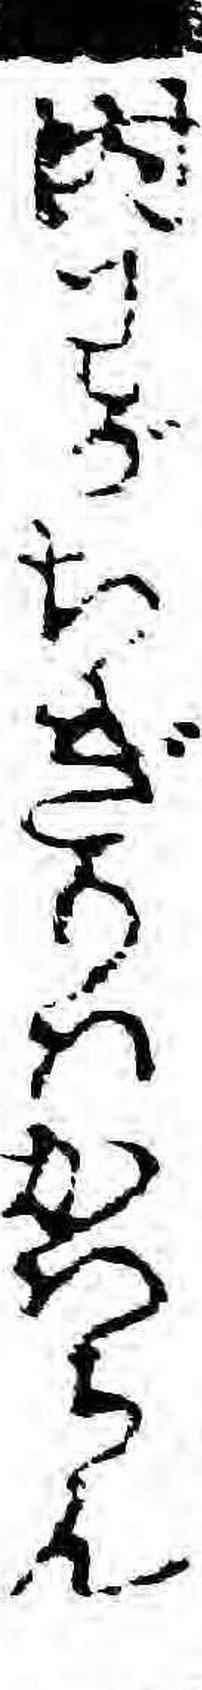時わがちぎりはかはらん
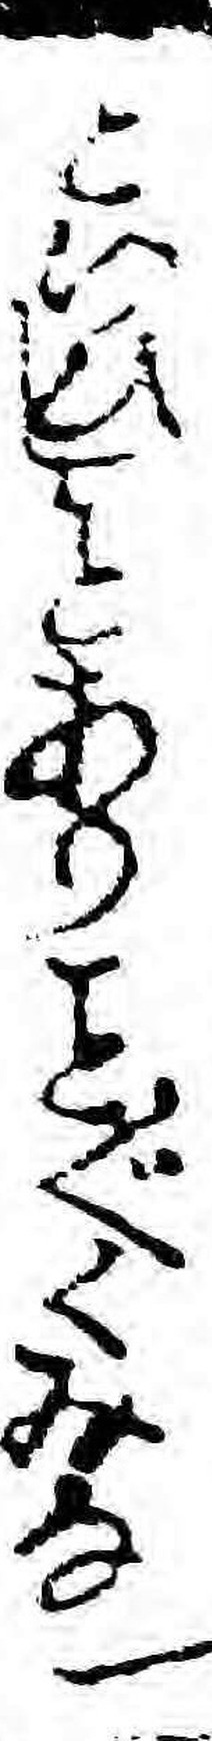といひしことありこと〴〵くみな
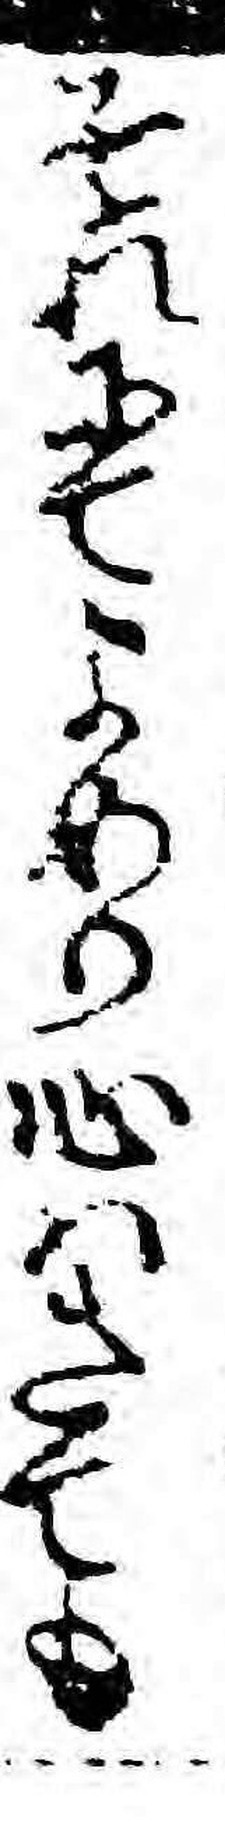それにてよめり心はさても
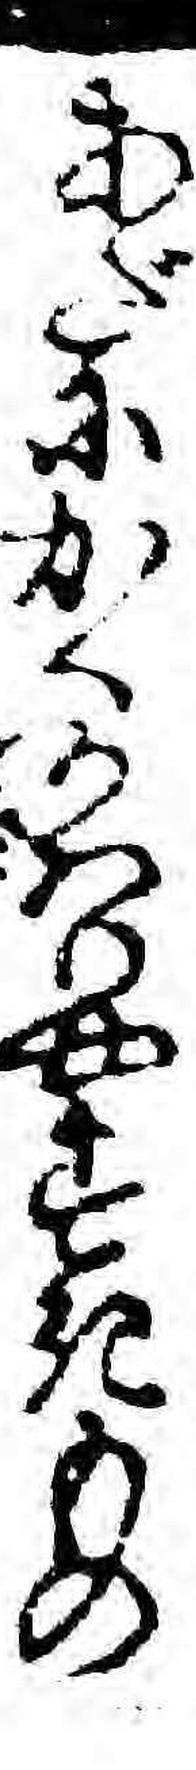あだにかくかはりやすきもの
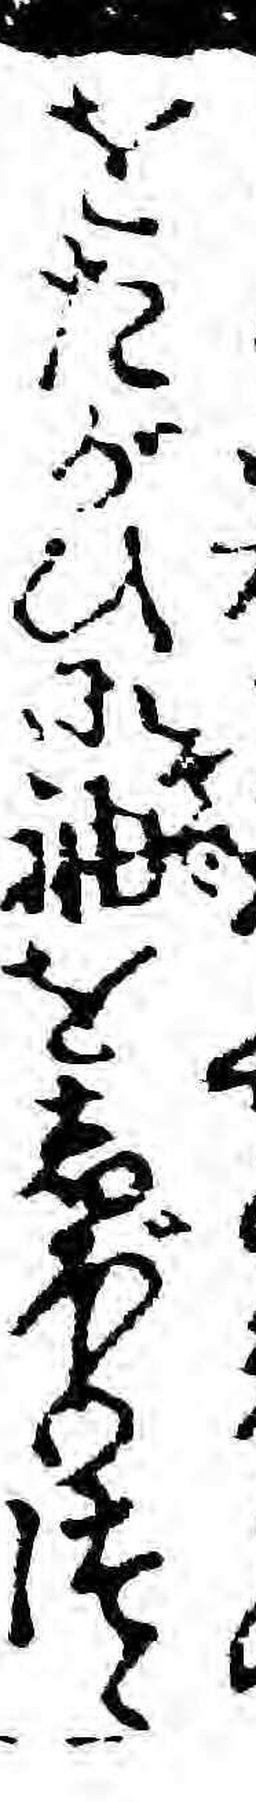をたがひに袖をしぼりつゝ
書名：頭書和歌注譯／壽賀多百人一首小倉錦
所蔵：国文学研究資料館
